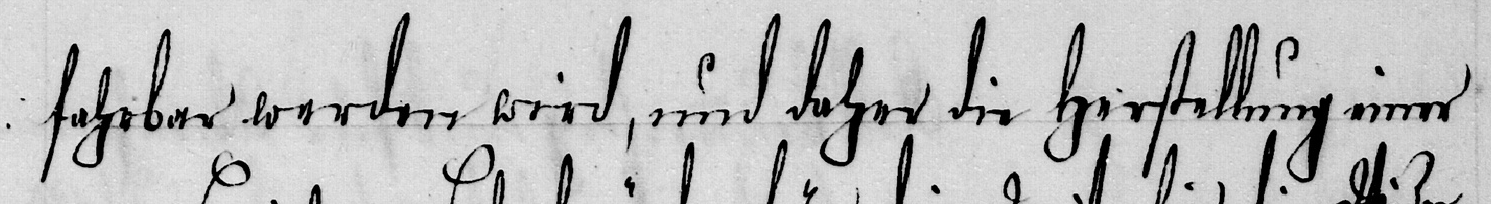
fahrbar werden wird, und daher die Herstellung
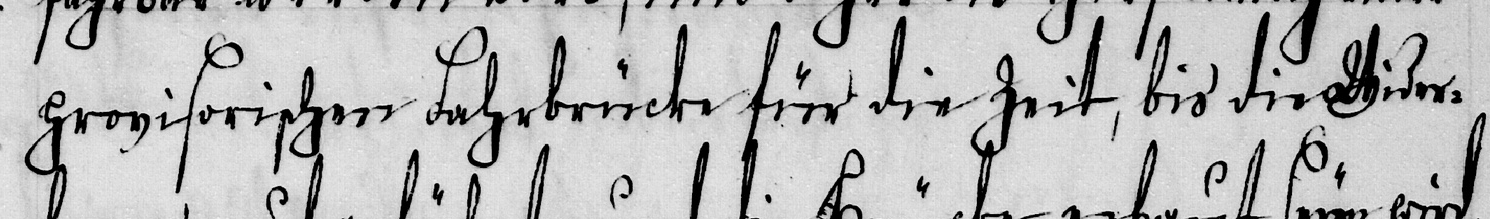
provisorischen Fahrbrücke für die Zeit, bis die Wider¬
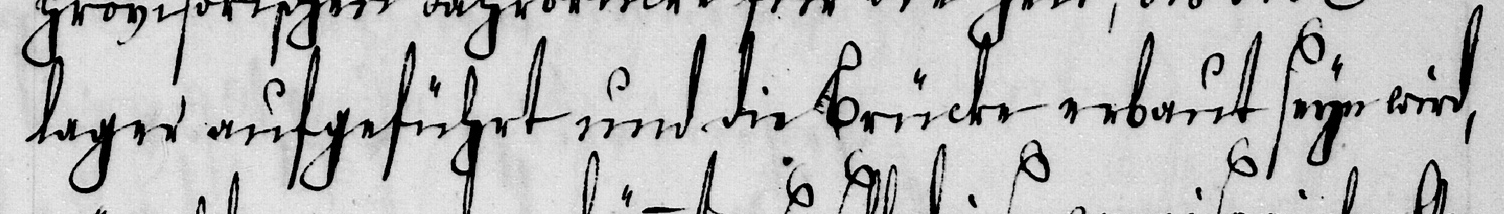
lager aufgeführt und die Brücke erbaut seyn wird,
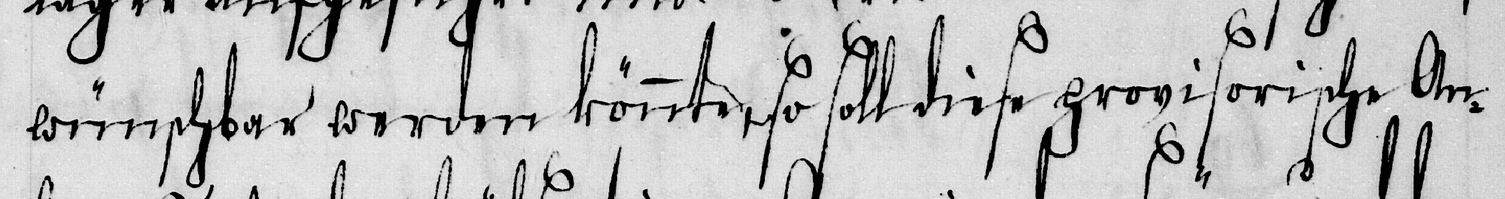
wünschbar werden könnte, so soll diese provisorische An¬
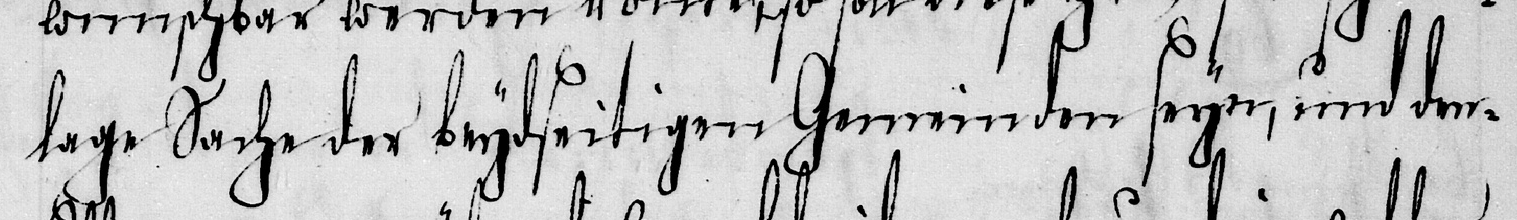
lage Sache der beydseitigen Gemeinden seyn, und den¬
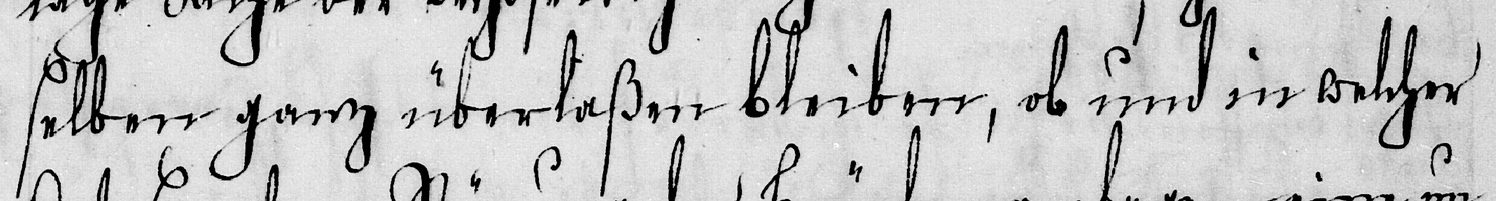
selben ganz überlaßen bleiben, ob und in welcher
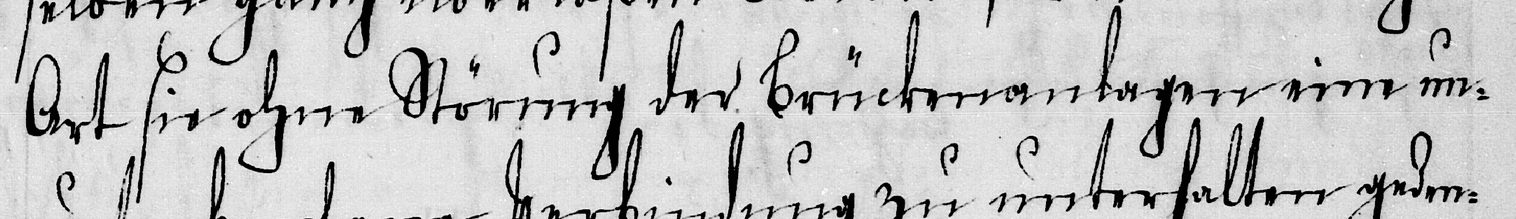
Art sie ohne Störung der Brückenanlagen eine un¬
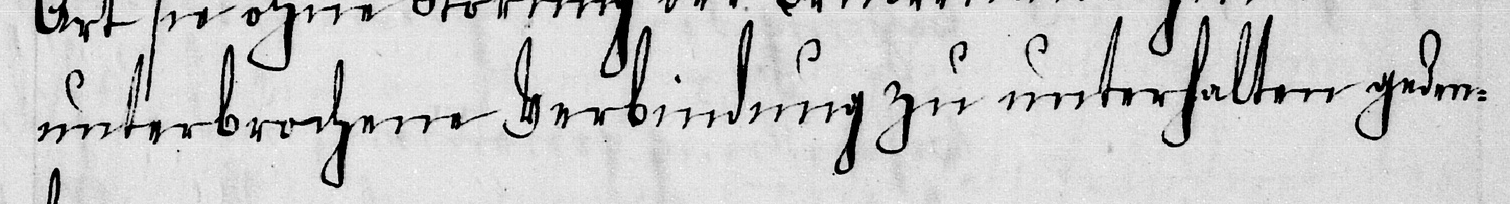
unterbrochene Verbindung zu unterhalten geden¬
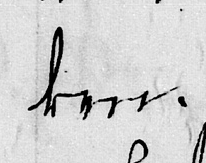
ken.
